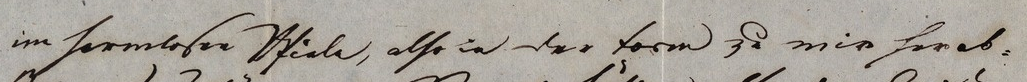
im formlosen Spiele, also in der Form zu mir herab-
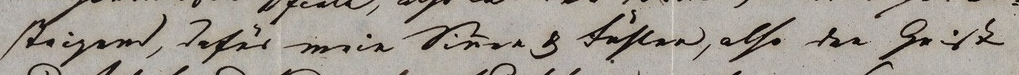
steigend, dafür mein Sinnen & Fühlen, also den Geist
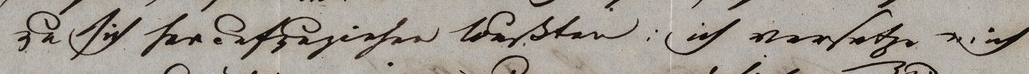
zu sich heraufzuziehen wußten: ich versetze mich
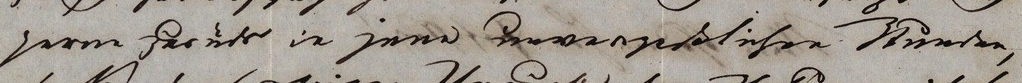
gerne zurück in jene unvergeßlichen Stunden,
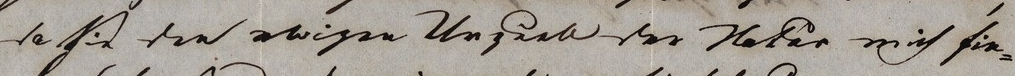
da Sie den ewigen Urquell der Natur mich fin-
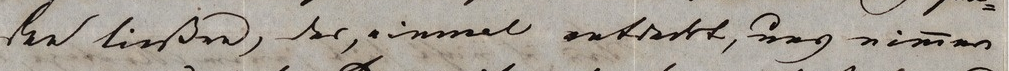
den ließen, der, einmal entdeckt, uns nimmer
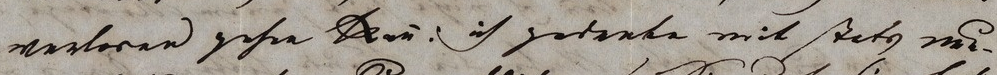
verloren gehen kann: ich gedenke mit stets neu-
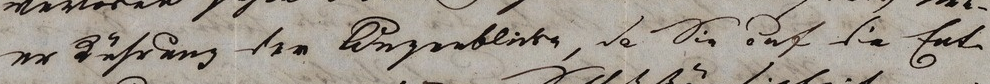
er Rührung der Augenblicke, da Sie auf die Ent-
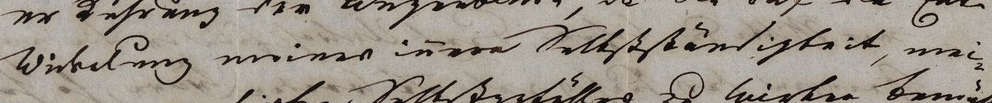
wickelung meiner innern Selbstständigkeit, mei-
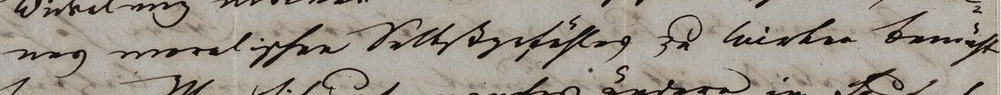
nes moralischen Selbstgefühles zu wirken bemüht
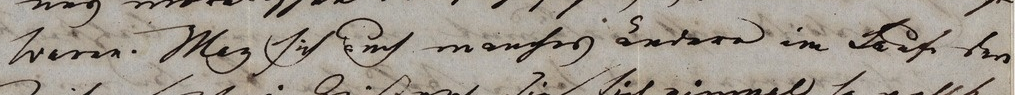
waren. Mag sich auch manches ändern im Laufe der
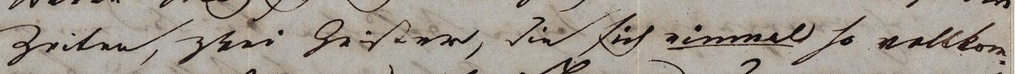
Zeiten, zwei Geister, die sich einmal so vollkom-
